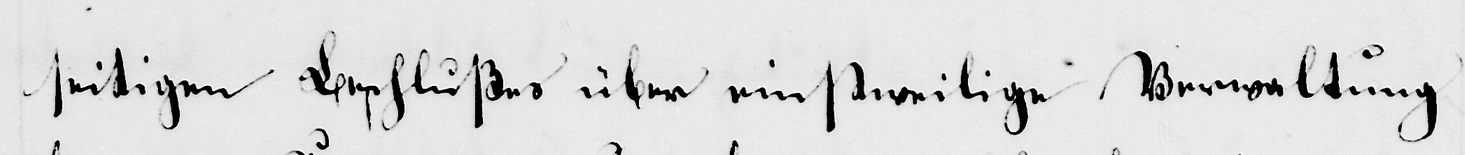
seitigen Beschlußes über einstweilige Verwaltung
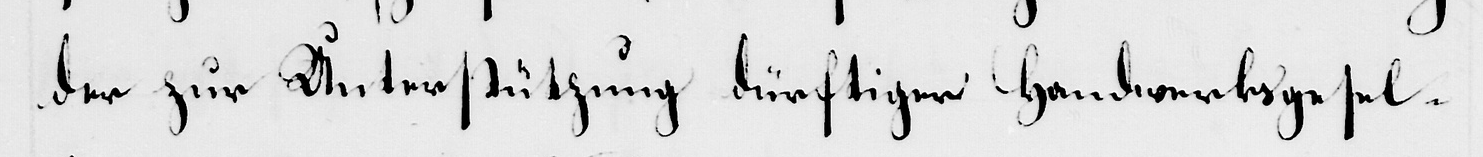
der zur Unterstützung dürftiger Handwerksgesel¬
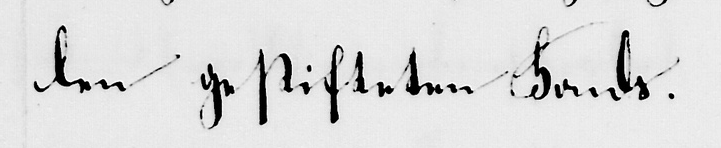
len gestifteten Fonds.
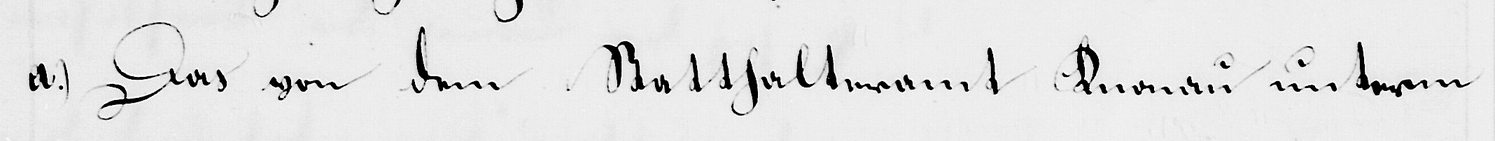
a.) Das von dem Statthalteramt Knonau unterm
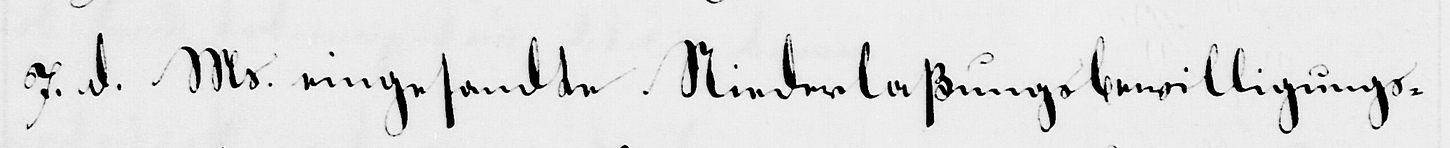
7. d. Ms. eingesandte Niederlaßungsbewilligungs¬
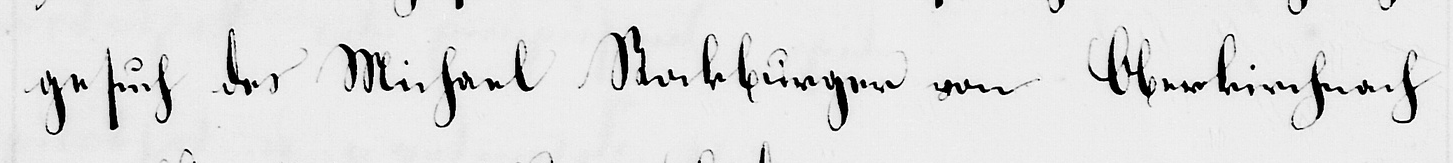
gesuch des Michael Stakburger von Oberkirchnach
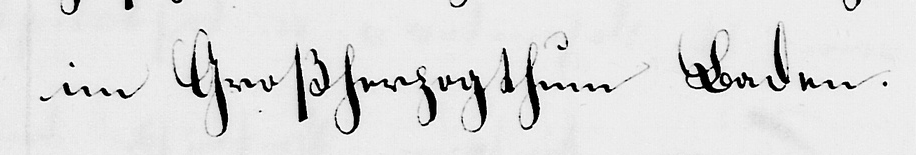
im Großherzogthum Baden.
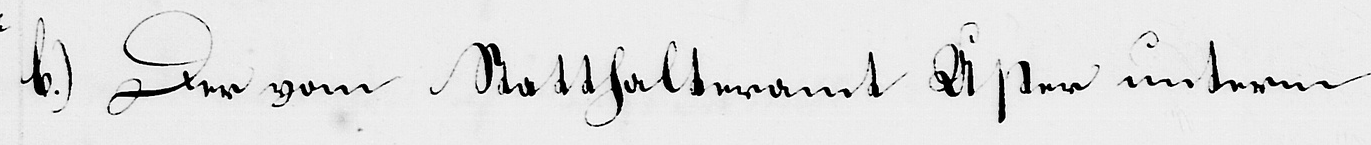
b.) Der vom Statthalteramt Uster unterm
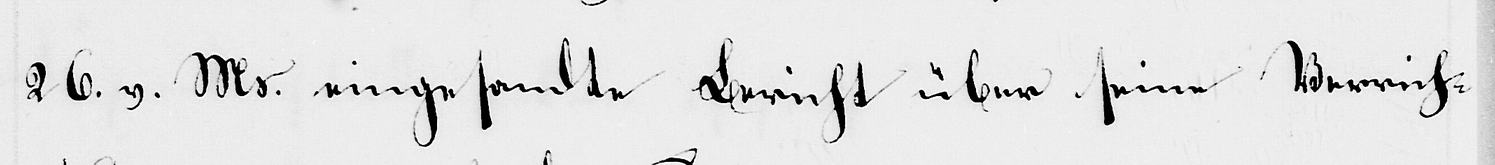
26. v. Ms. eingesandte Bericht über seine Verrich¬
